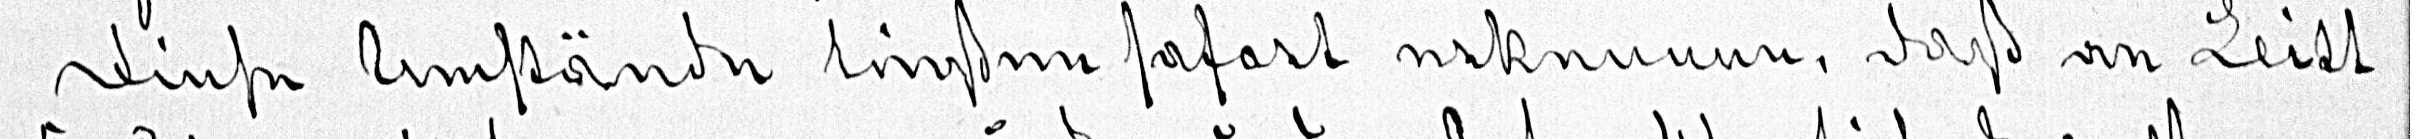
Diese Umstände ließen sofort erkennen, daß an Leitl
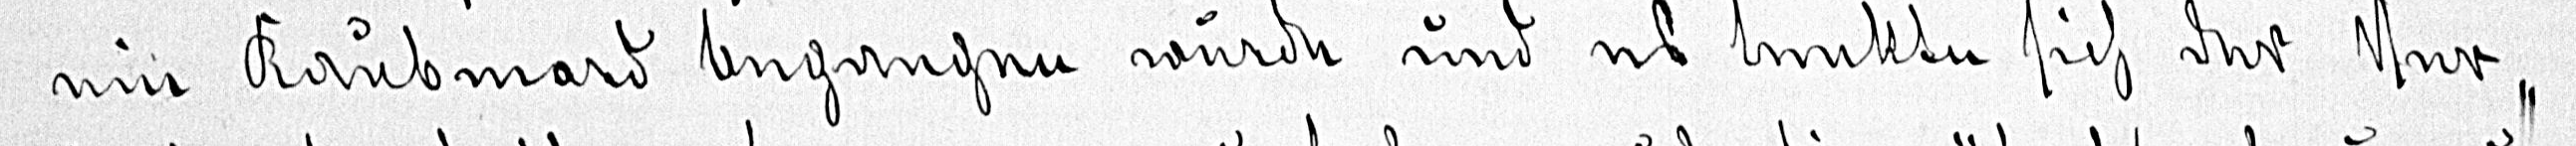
ein Raubmord begangen wurde und es lenkte sich der Ver¬
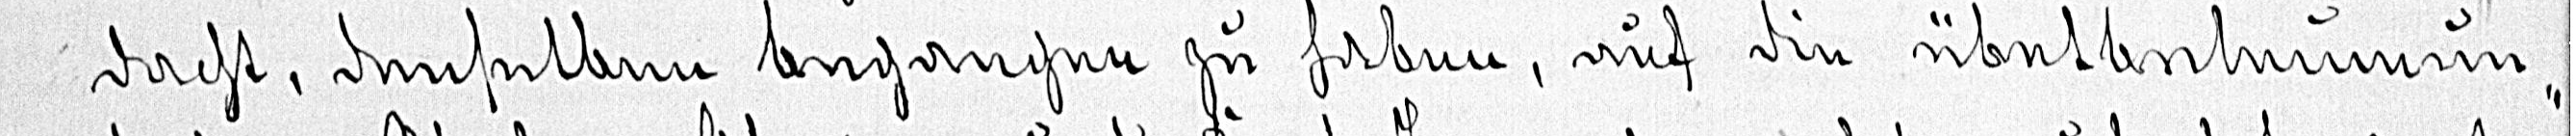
dacht, denselben begangen zu haben, auf die übetbeleumun¬
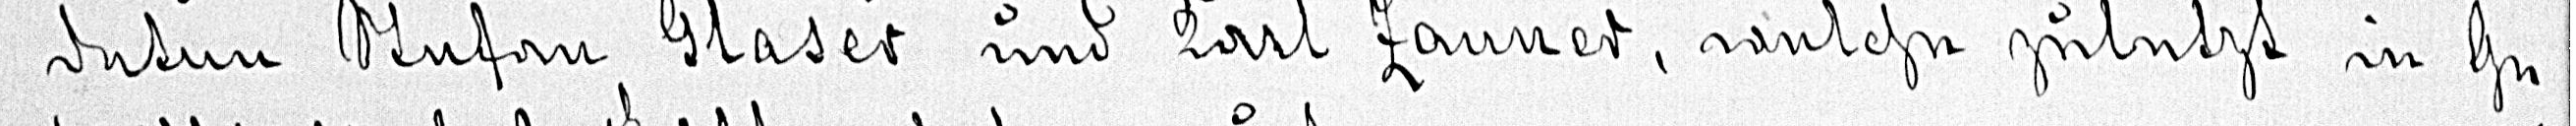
daten Stefan Glaser und Karl Zauner, welche zuletzt, in Ge¬
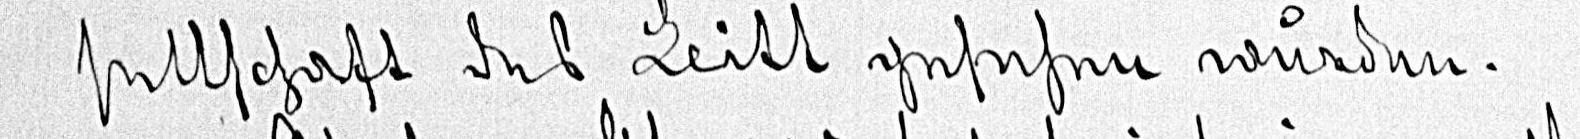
sellschaft des Leitl gesehen wurden.
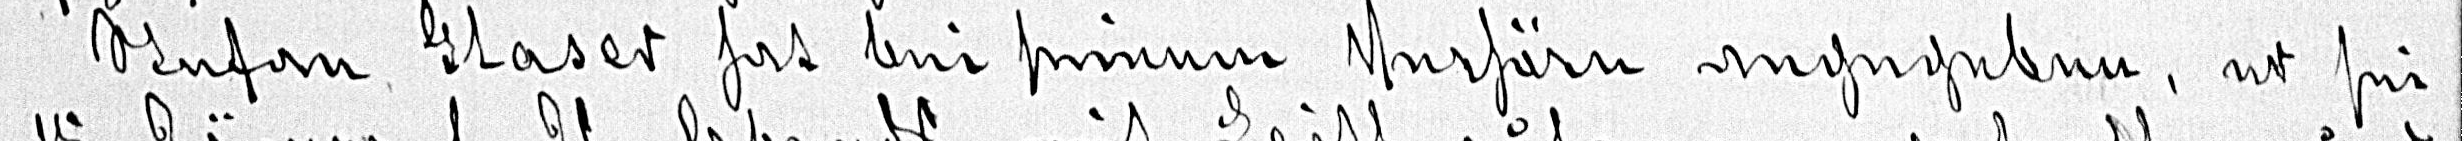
Stefan Glaser hat bei seinem Verhörn angegeben, er sei
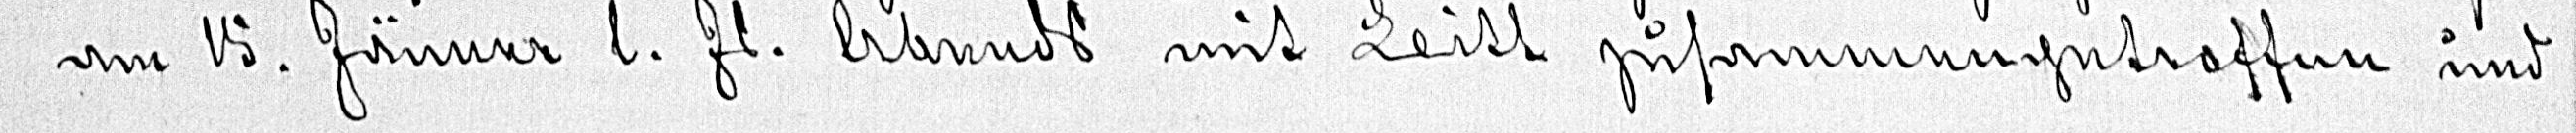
am 15. Jänner 1. Fs. Abends mit Leitl zusammengetroffen und
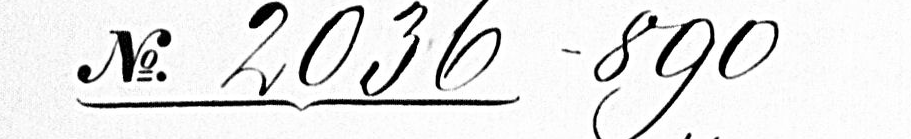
N° 2036 - 890
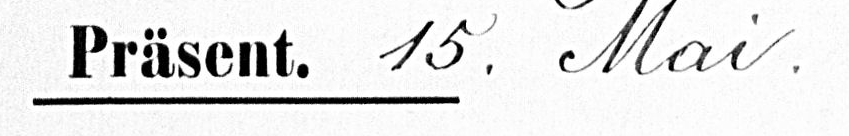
Präsent. 15. Mai.
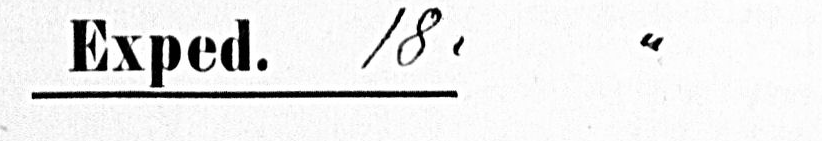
Exped. 18. Mai.
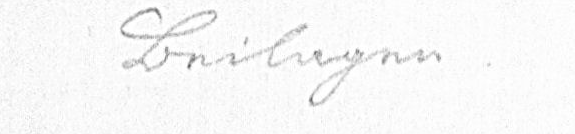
Beilagen
